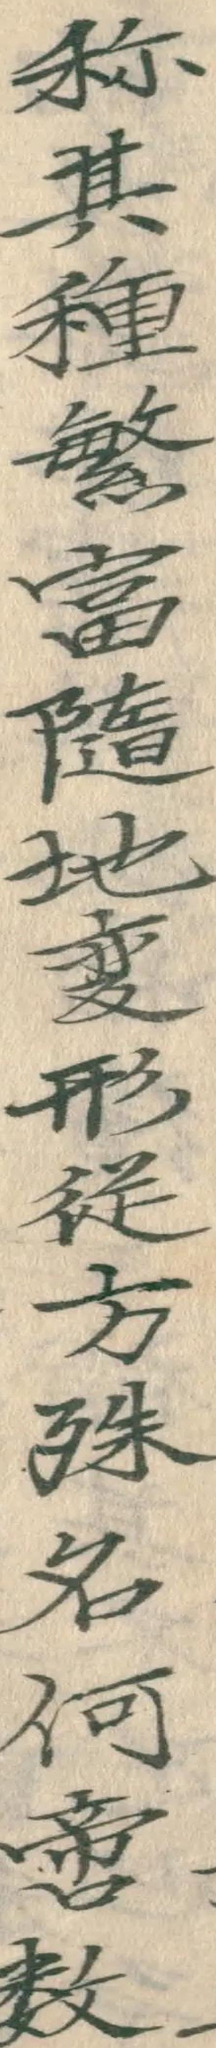称其種繁富隨地変形従方殊名何啻数
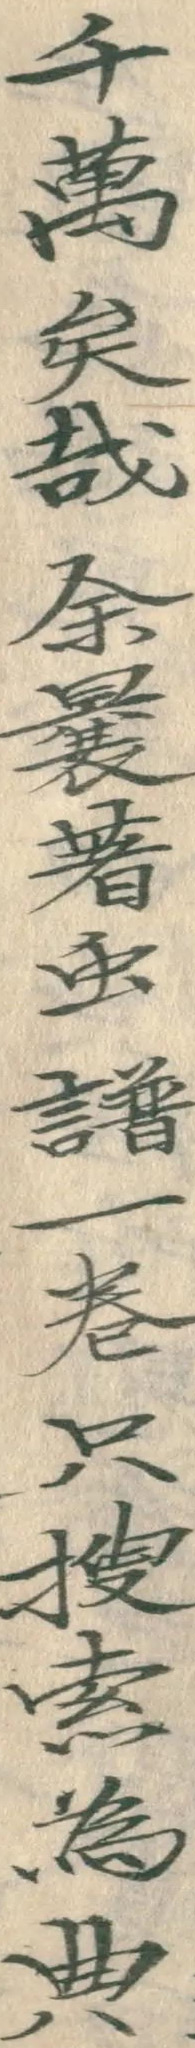千萬矣哉余曩著虫譜一巻只捜索為典
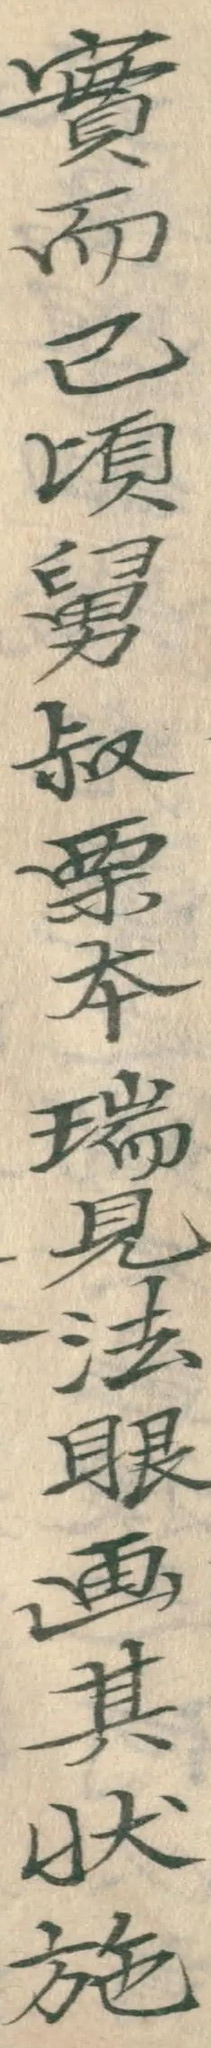實而已頃舅叔栗本瑞見法眼画其状施
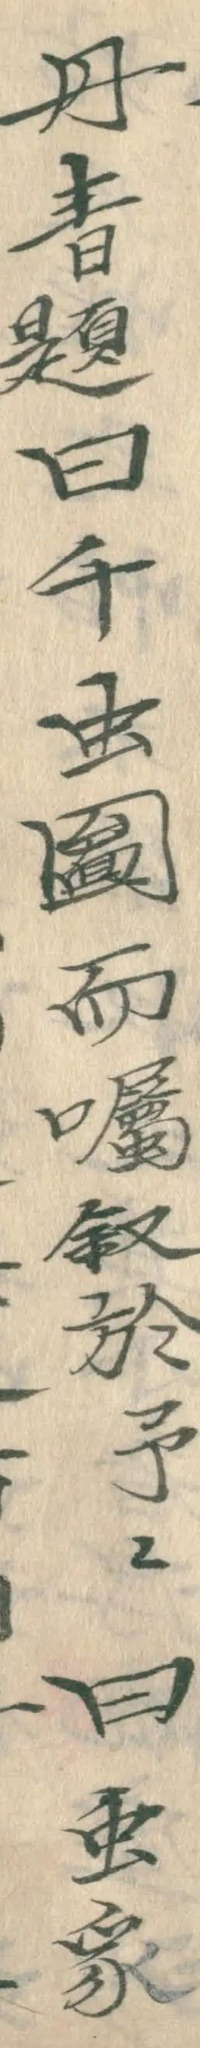丹青題曰千虫圖而嘱叙於予々曰虫象
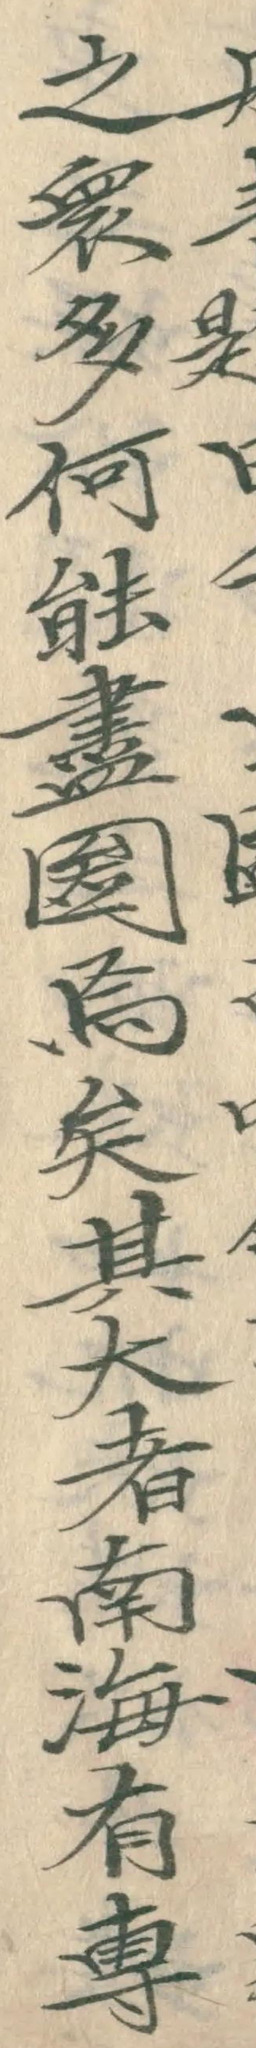之衆多何能盡圖焉矣其大者南海有専

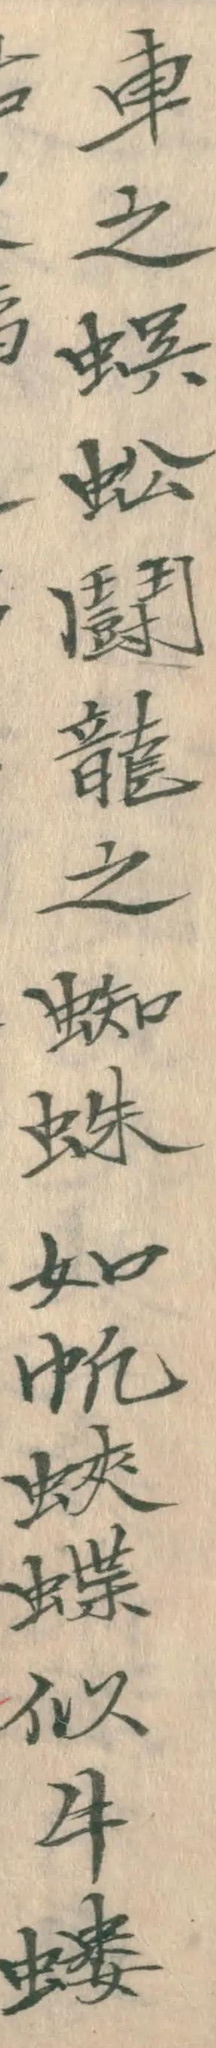車之蜈蚣闘龍之蜘蛛如帆蛺蝶似牛蝼
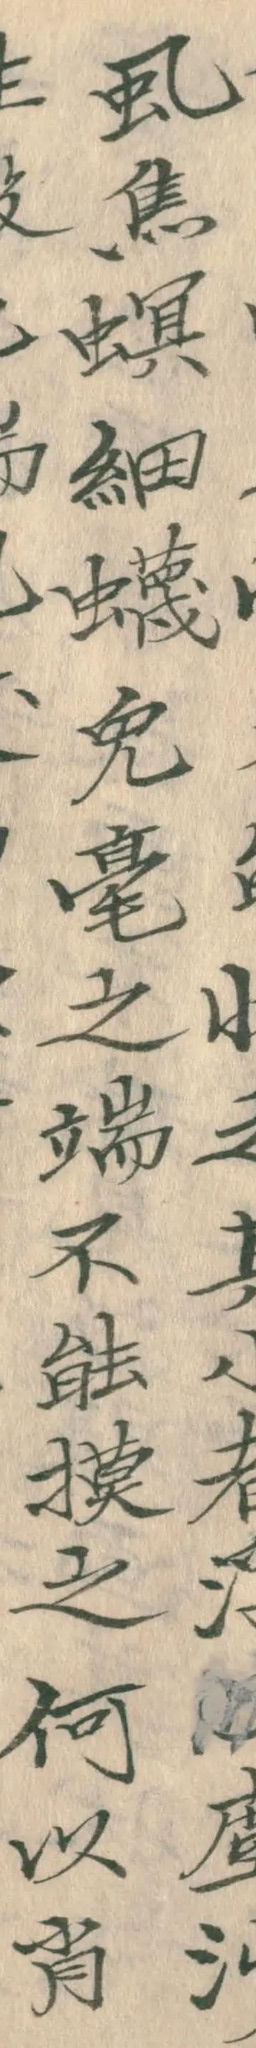虱焦螟細蠛兎毫之端不能摸之何以肖
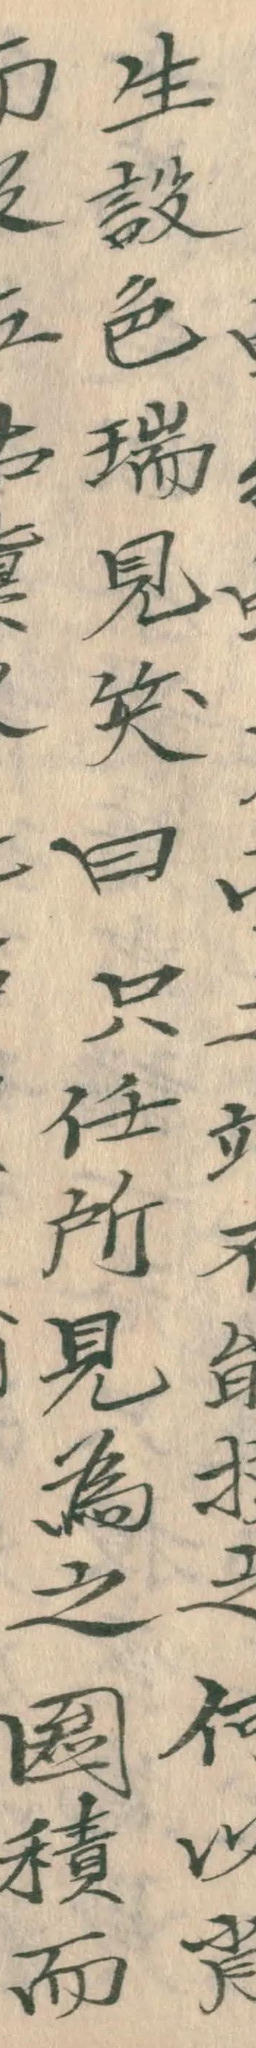生設色瑞見笑曰只任所見為之圖積而
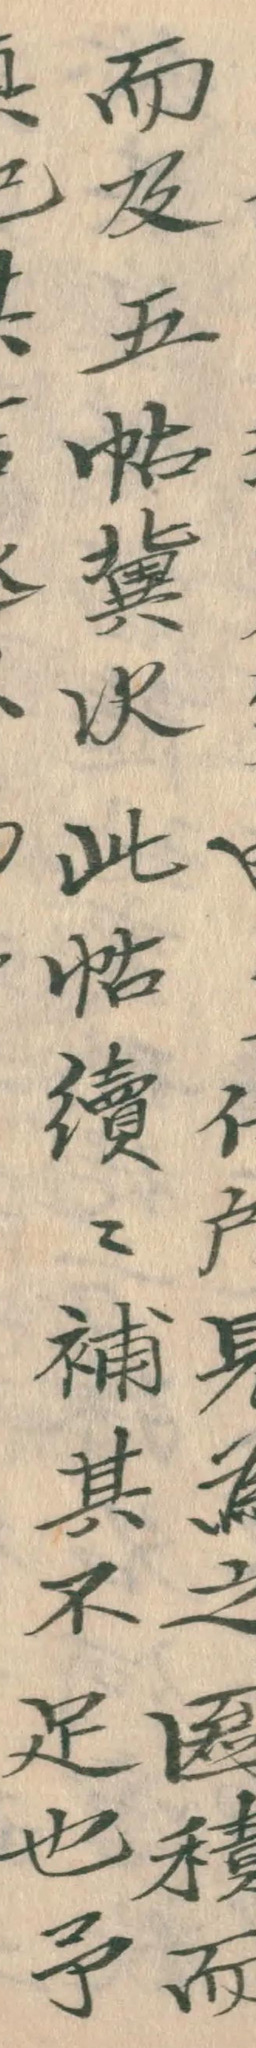而及五帖冀决此帖續々補其不足也予
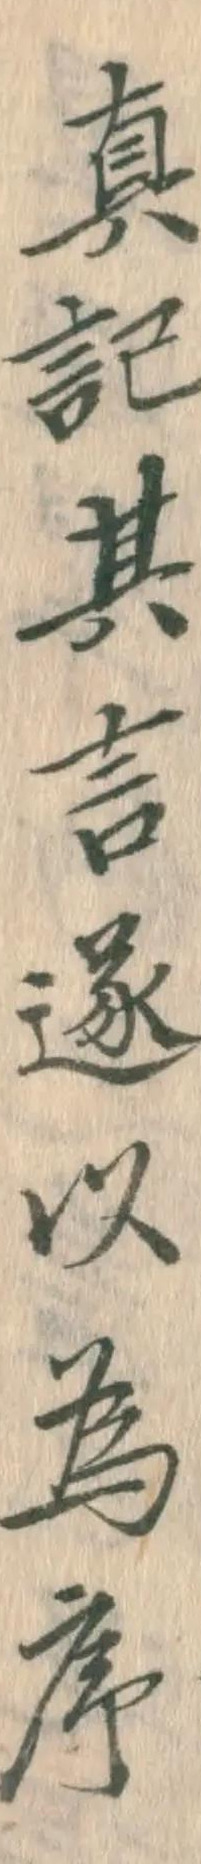真記其言遂以為序
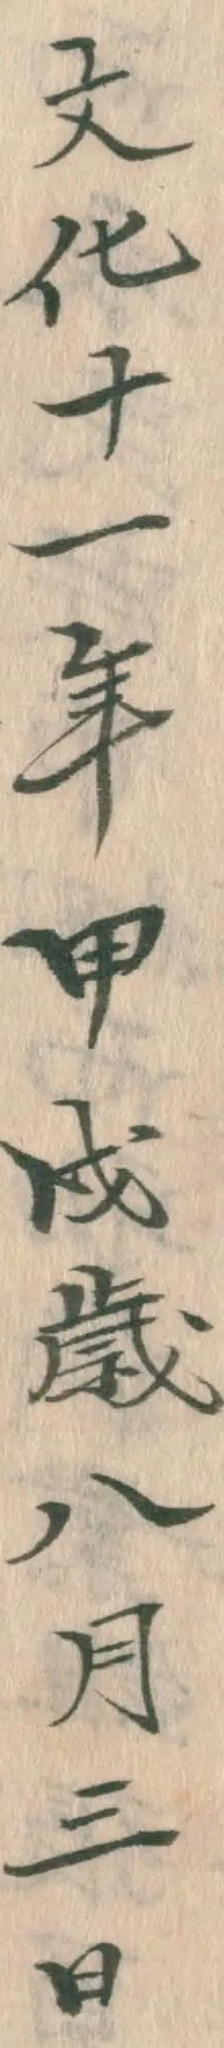文化十一年甲戌歳八月三日
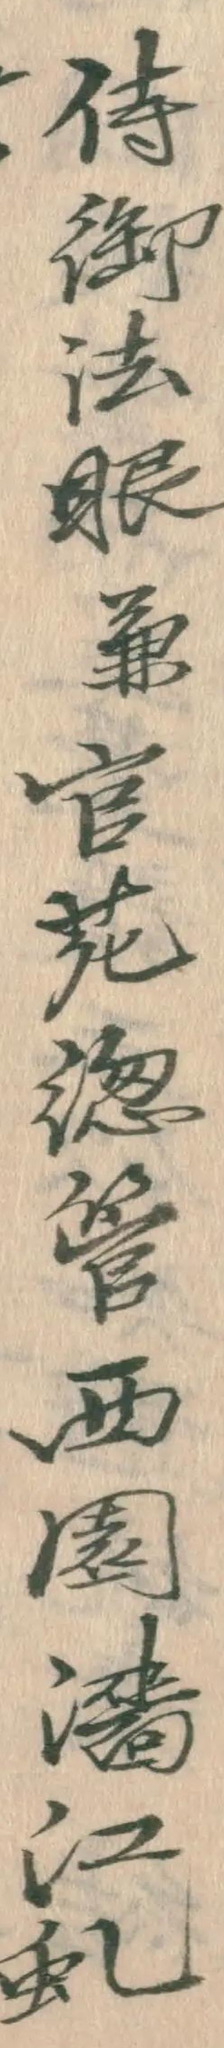侍御法眼兼官苑総管西園濇江虬
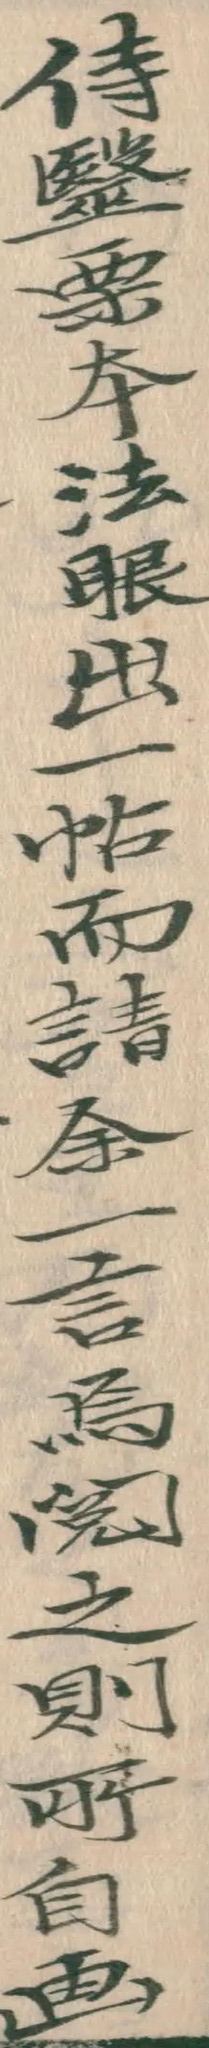侍毉栗本法眼出一帖而請余一言焉閲之則所自画
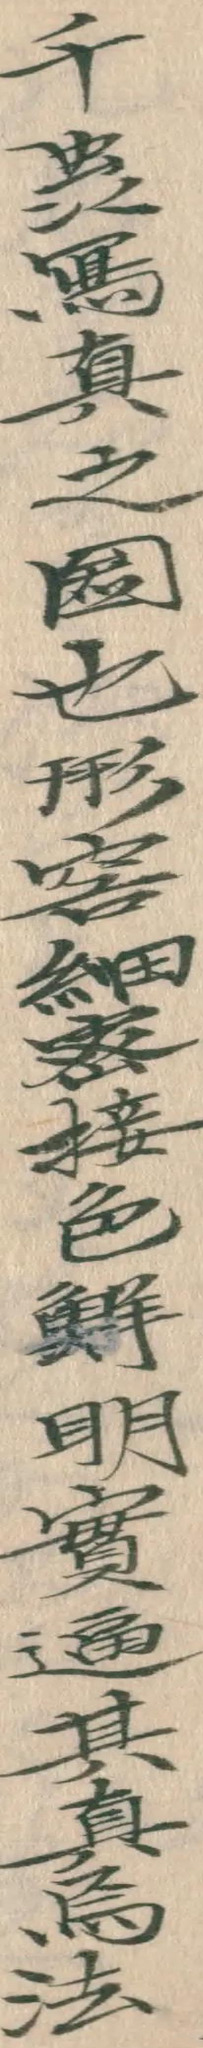千蟲冩真之圖也形容細密接色鮮明實逼其真焉法
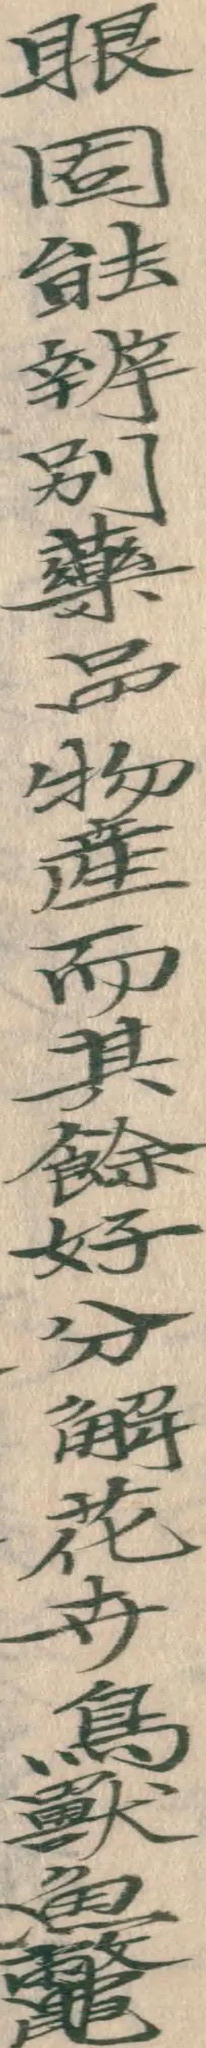眼固能辨別藥品物産而其餘好分解花卉鳥獣魚龞
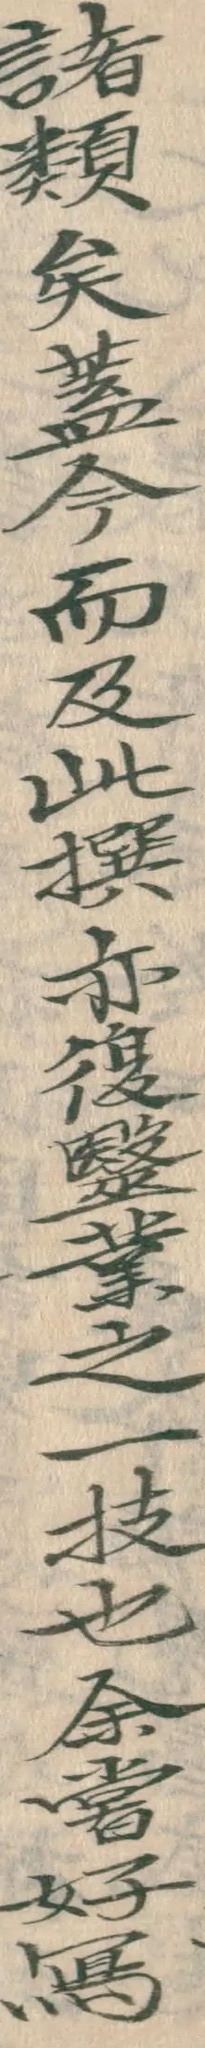諸類矣蓋今而及此撰亦復毉業之一技也余甞好冩
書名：千蟲譜 3巻. [1]
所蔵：国立国会図書館 National Diet Library, JAPAN
